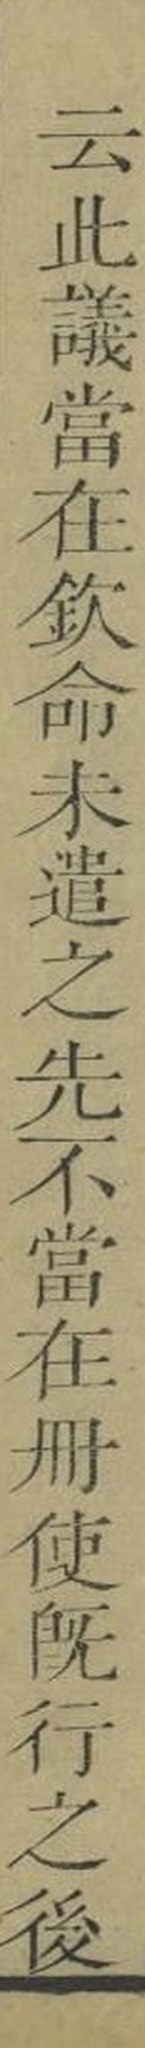云此議当在欽命未遣之先不当在冊使既行之後
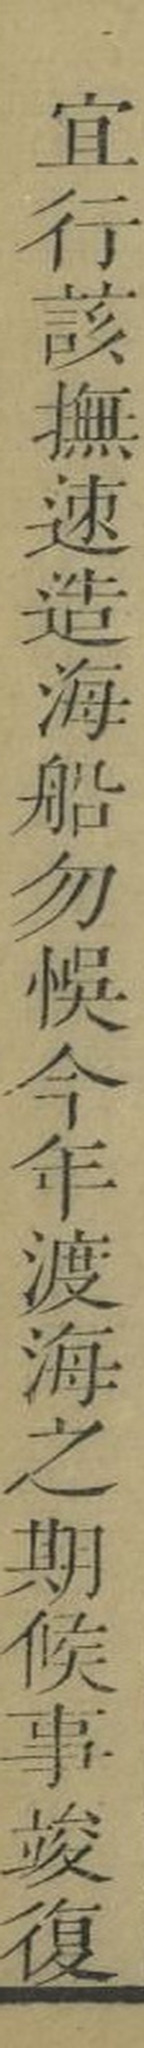宜行該撫速造海船勿悞今年渡海之期候事竣復

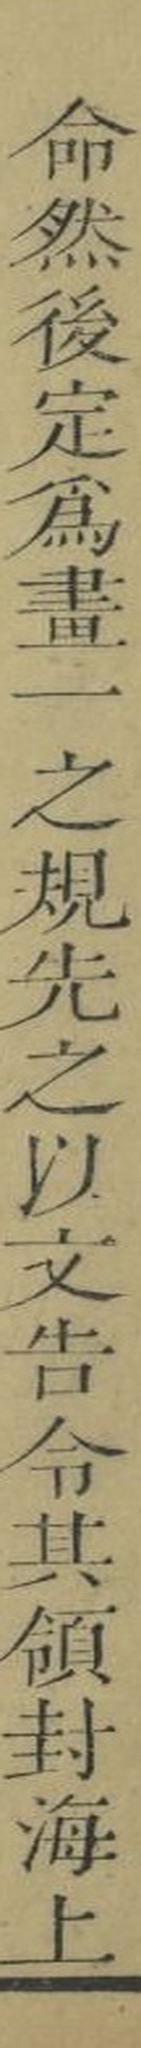命然後定為画一之規先之以文告令其領封海上
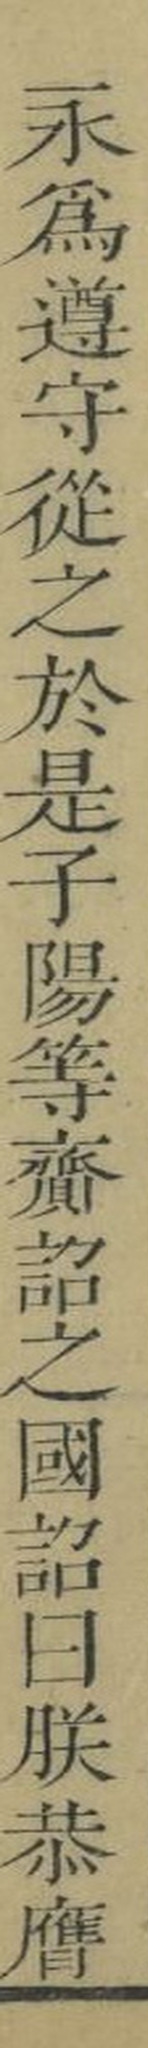永為遵守従之於是子陽等齎詔之国詔曰朕恭膺
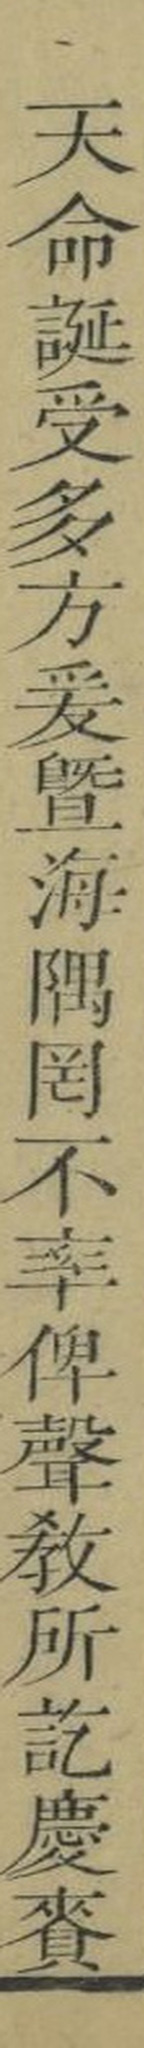天命誕受多方爰曁海隅罔不率俾声教所訖慶賚
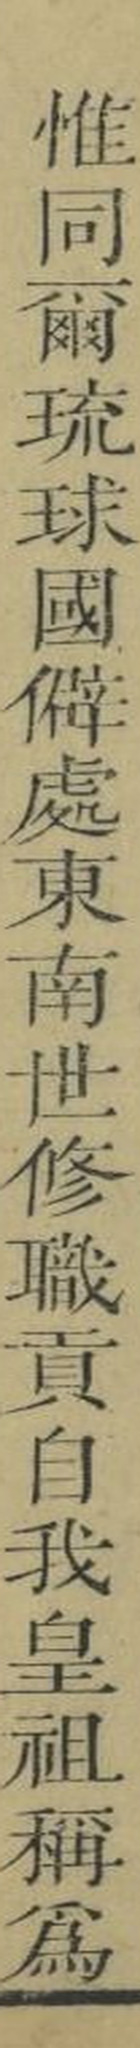惟同爾琉球国僻処東南世修職貢自我皇祖称為
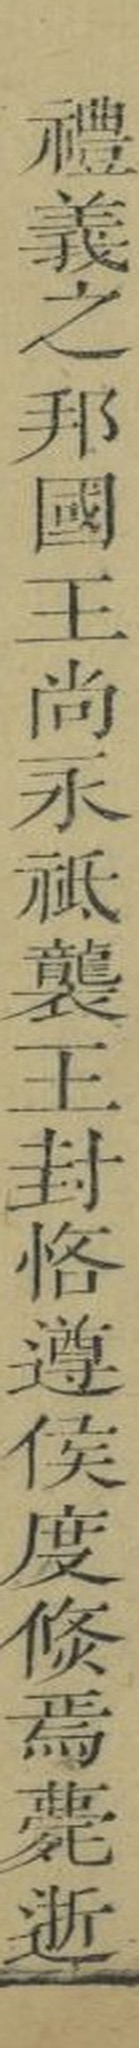礼義之邦国王尚永祇襲王封恪遵侯度倐焉薨逝
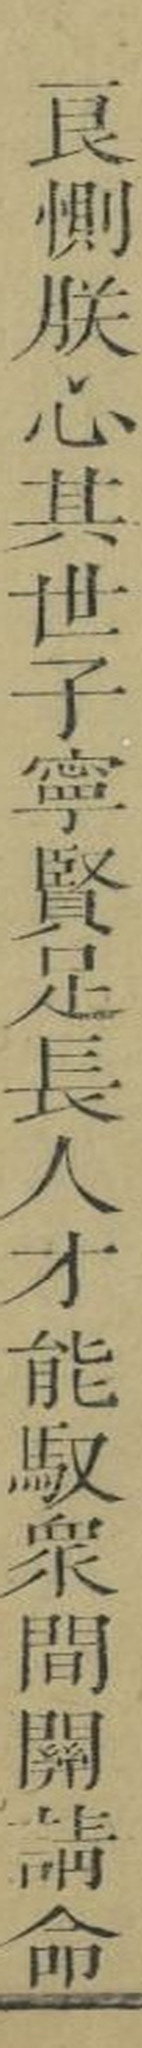良惻朕心其世子寧賢足長人才能馭衆間関請命
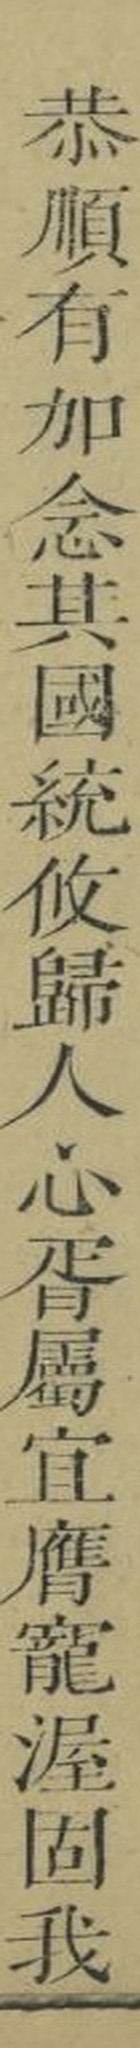恭順有加念其国統攸帰人心胥属宜膺寵渥固我
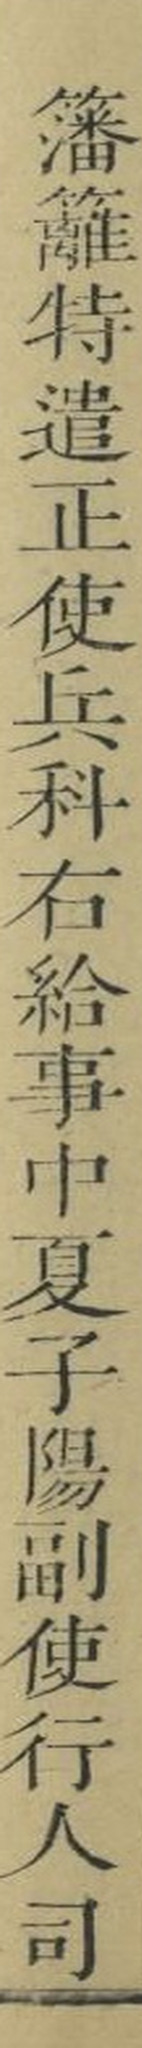籓籬特遣正使兵科右給事中夏子陽副使行人司
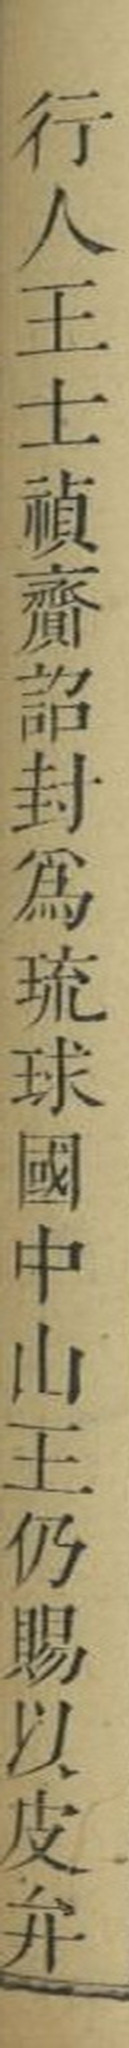行人王士禎齎詔封為琉球国中山王仍賜以皮弁
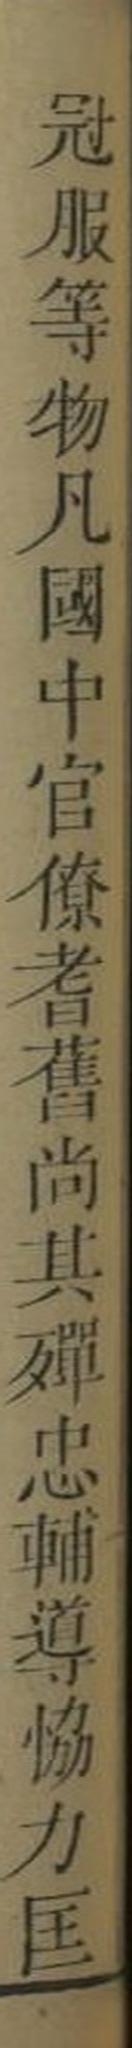冠服等物凡国中官僚耆旧尚其殫忠輔導恊力匡
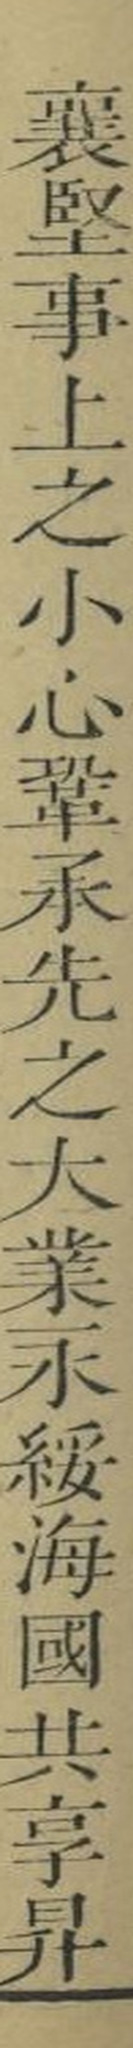襄堅事上之小心鞏承先之大業永綏海国共享昇
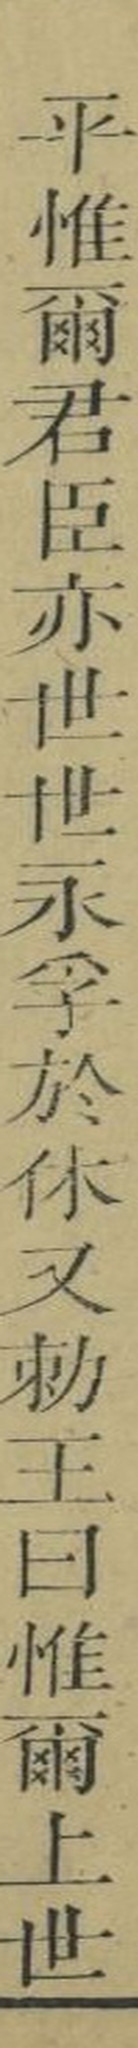平惟爾君臣亦世世永孚於休又勅王曰惟爾上世
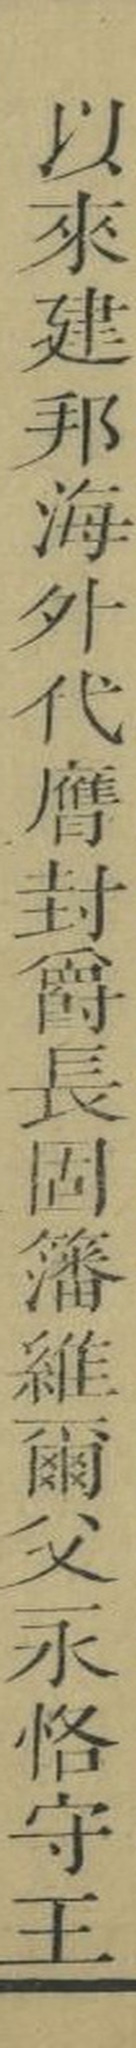以来建邦海外代膺封爵長固籓維爾父永恪守王
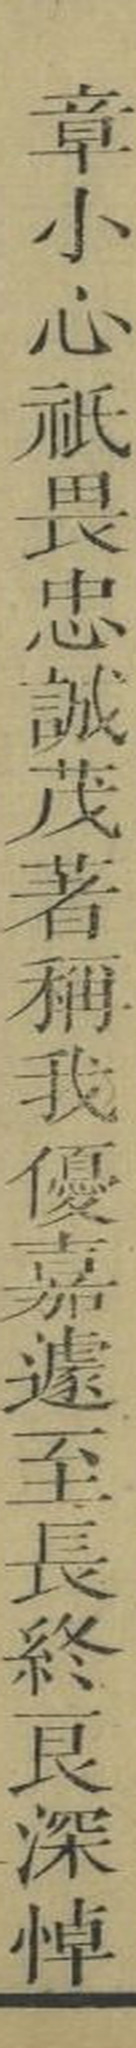章小心祇畏忠誠茂著称我優嘉遽至長終良深悼
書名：中山伝信録 巻三
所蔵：University of the Ryukyus Library
